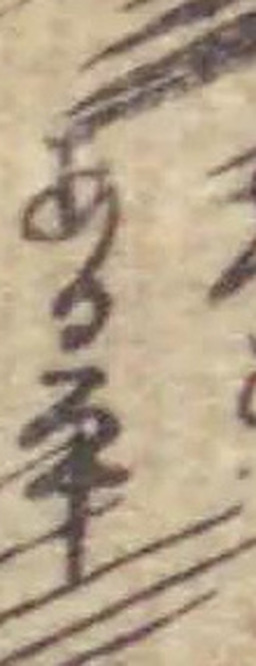ある平
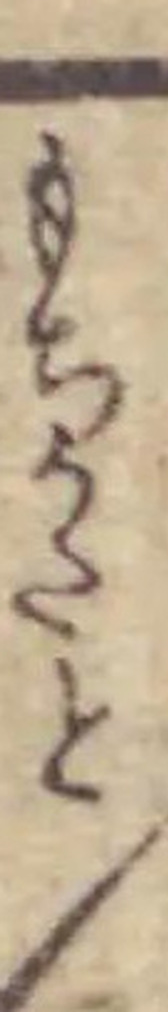もちかたと
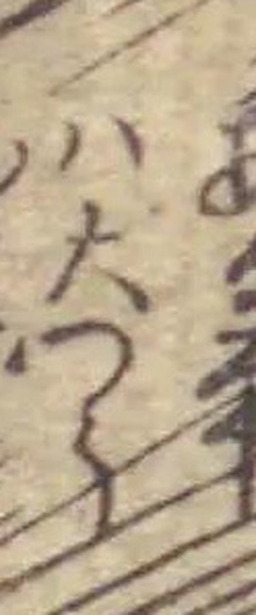は大つう
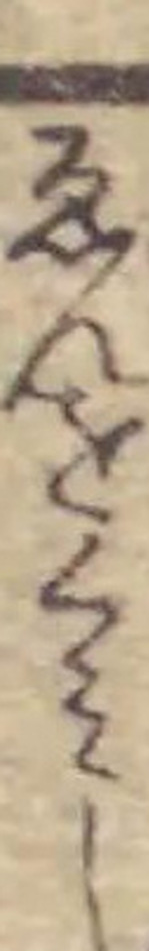ゑんをくみし
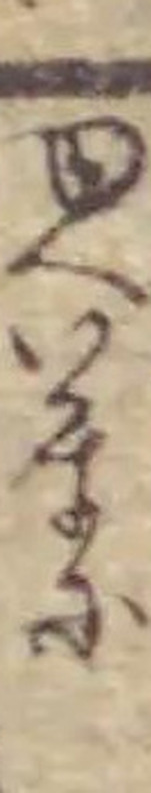ゆへいまに
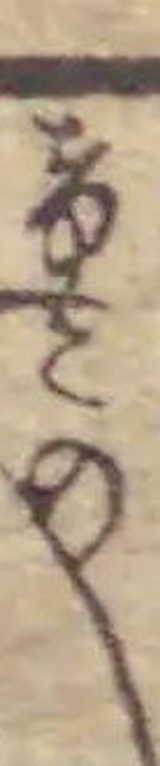けこの
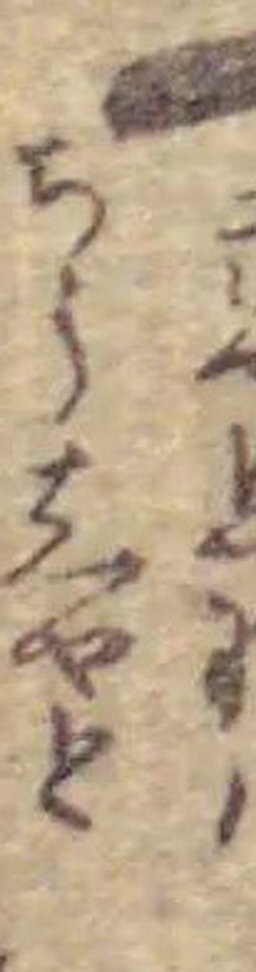ちうしやと
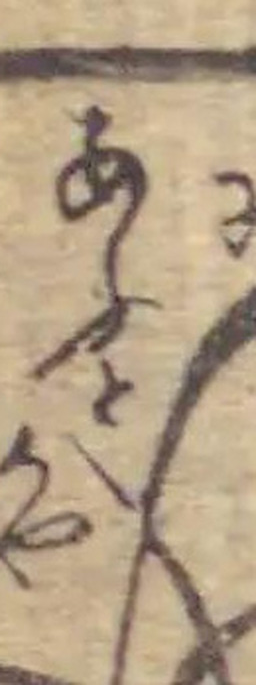あふと
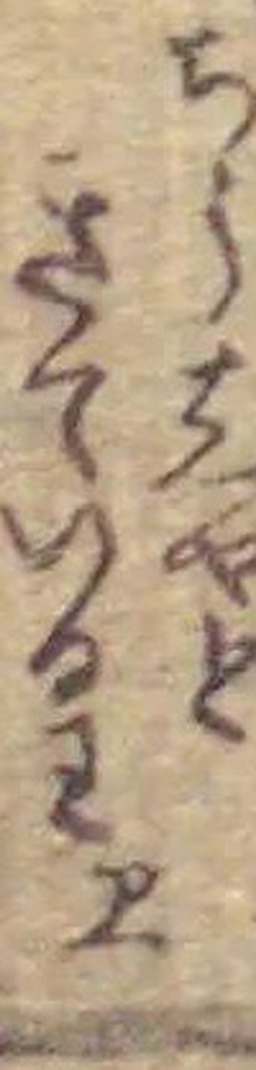きているわヱ

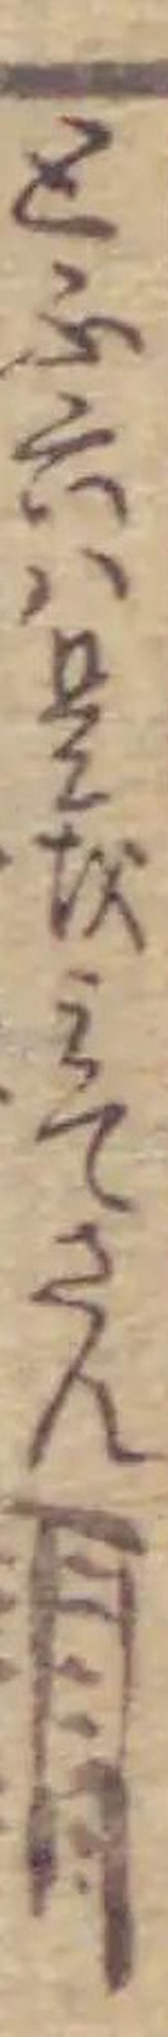とふ六は是をみてさん
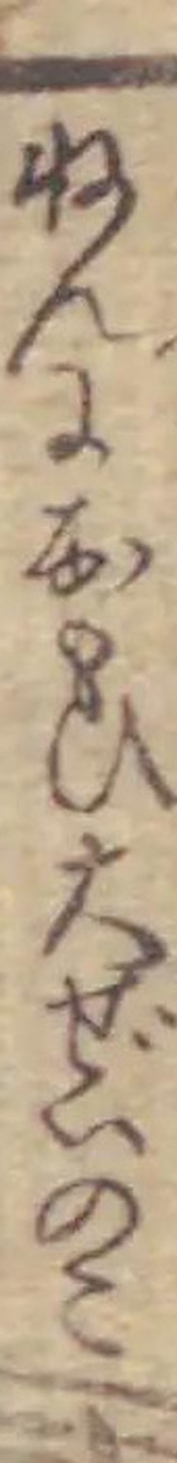ねんにおもひ大ぜいのこ
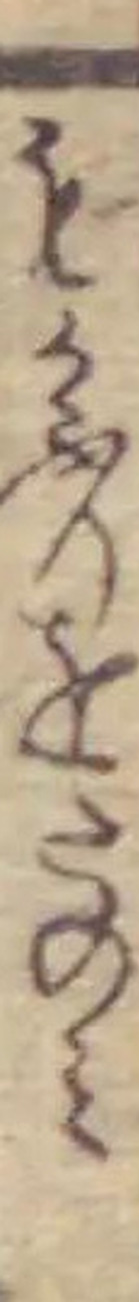もかふりをたのみ
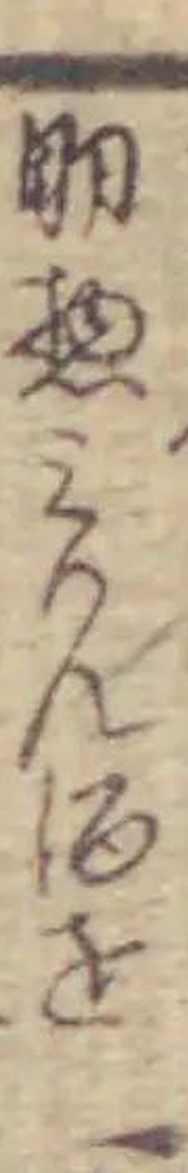助惣みりん酒を
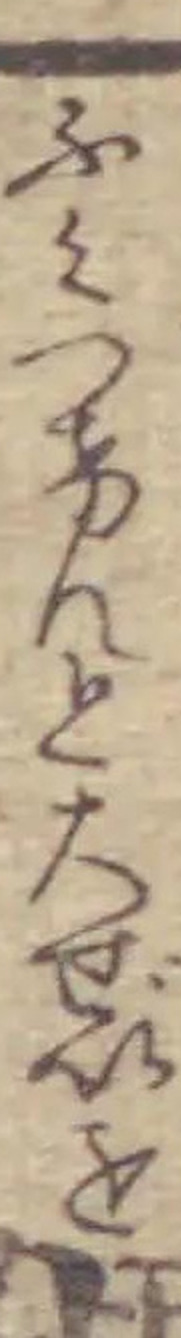ふみつけんと大ぜいを
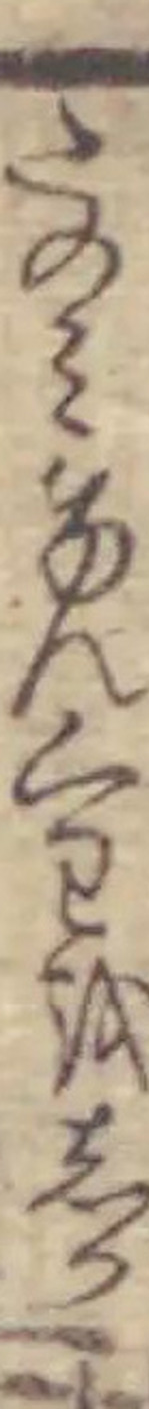たのみけんくわをしか
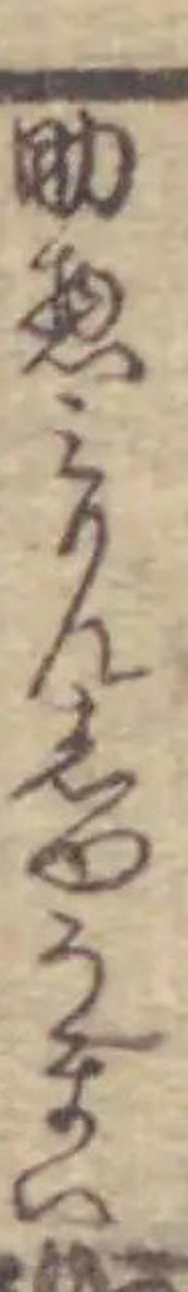助惣みりんしゆうまい
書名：餅酒腹中能同志 2巻
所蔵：国立国会図書館 National Diet Library, JAPAN
